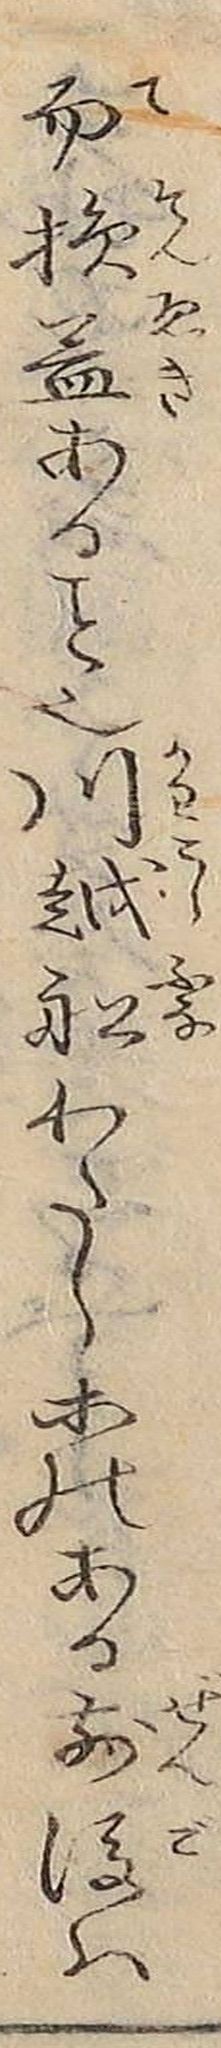而損益あること也川越船わたし等のある前後は
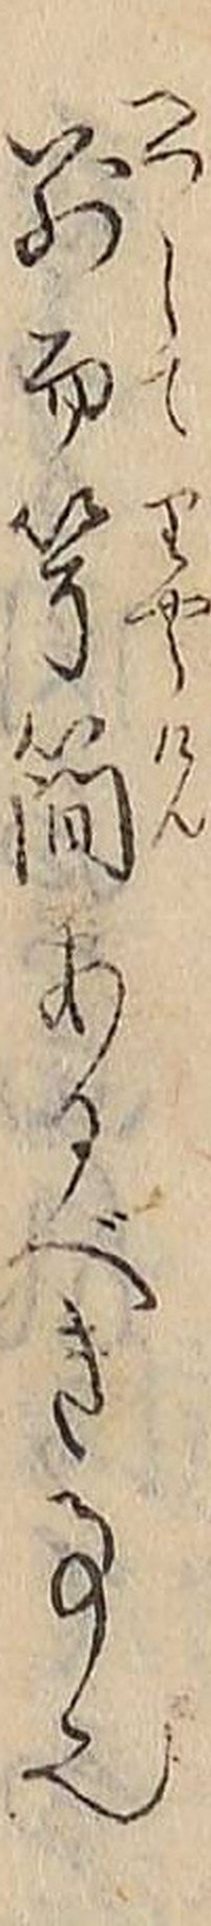別而了簡あるべき事也
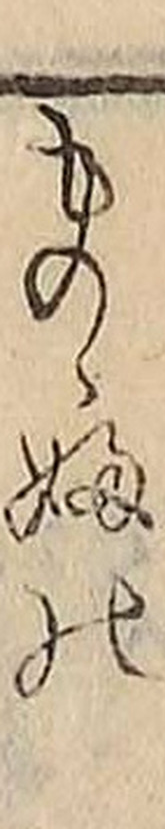ものゝふの
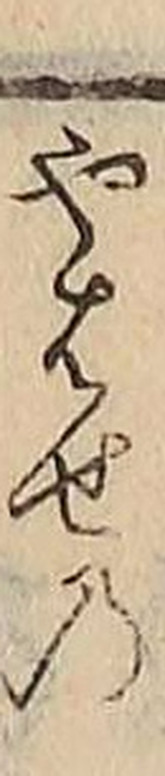やはせの
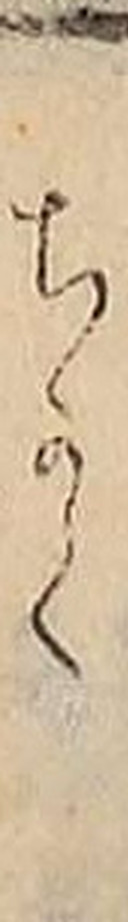ちかく
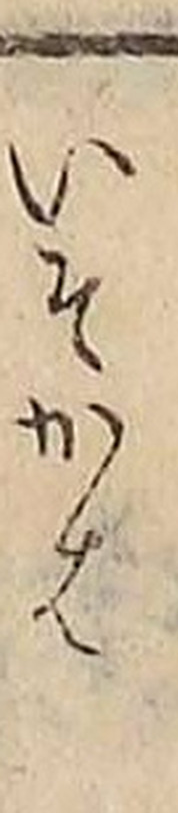いそかは
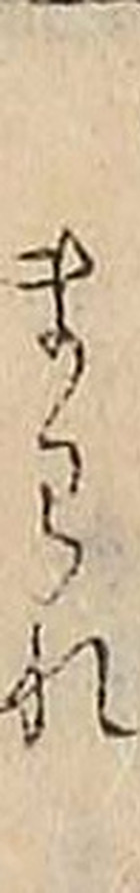まわれ
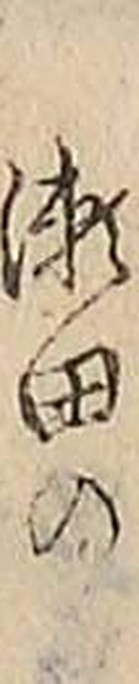瀬田の

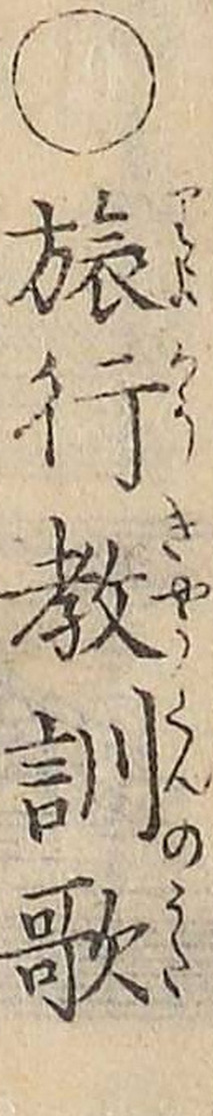○旅行教訓歌
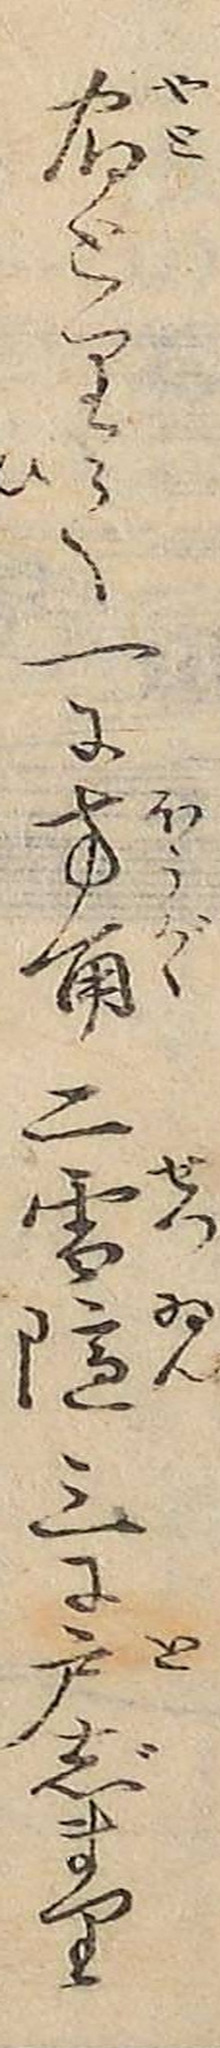宿とりて一に方角二雪隠三に戸じまり
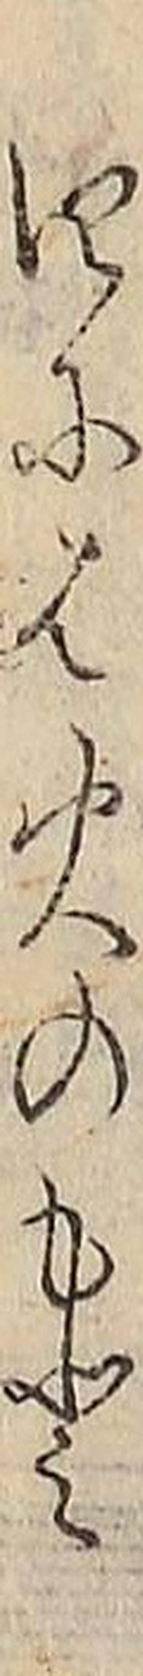四には火のもと
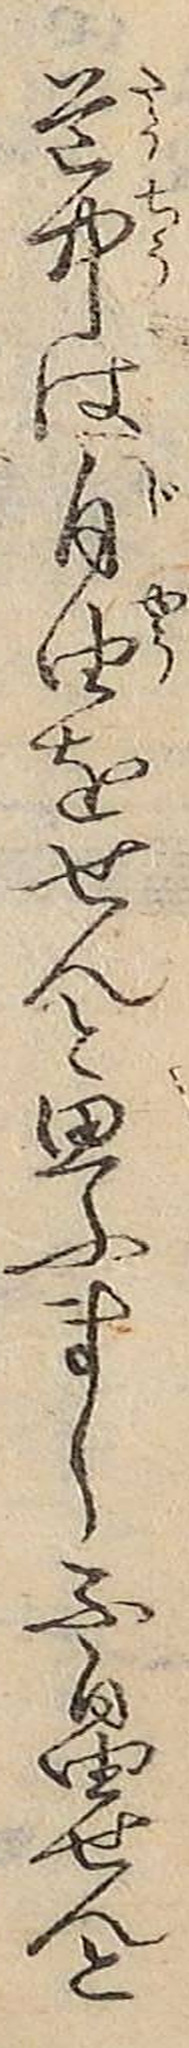道中は自由をせんと思ふましふ自由せんと
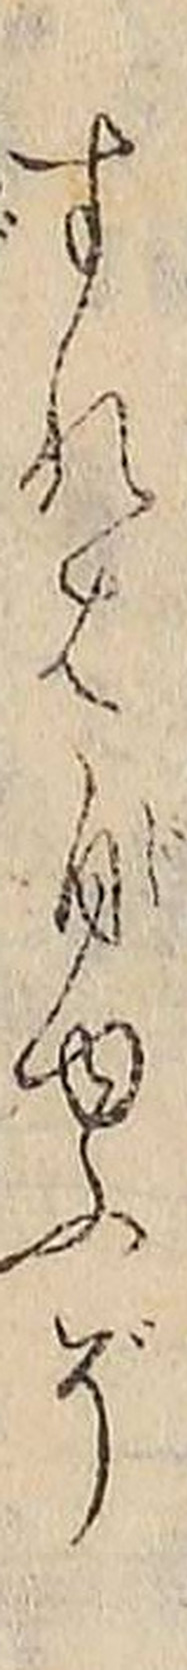すれは自ゆふぞ
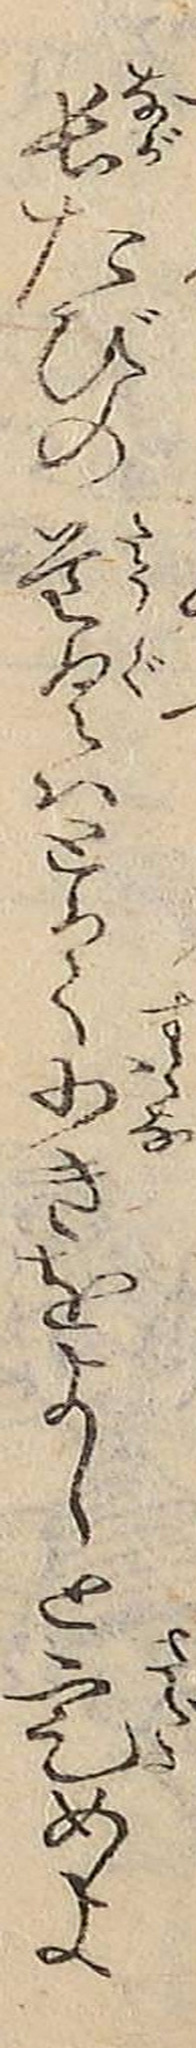長たびの道具はとかく少きをよしと定めよ
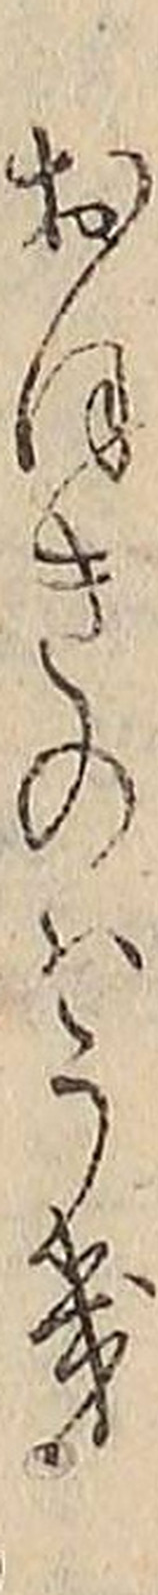おほきのはうき
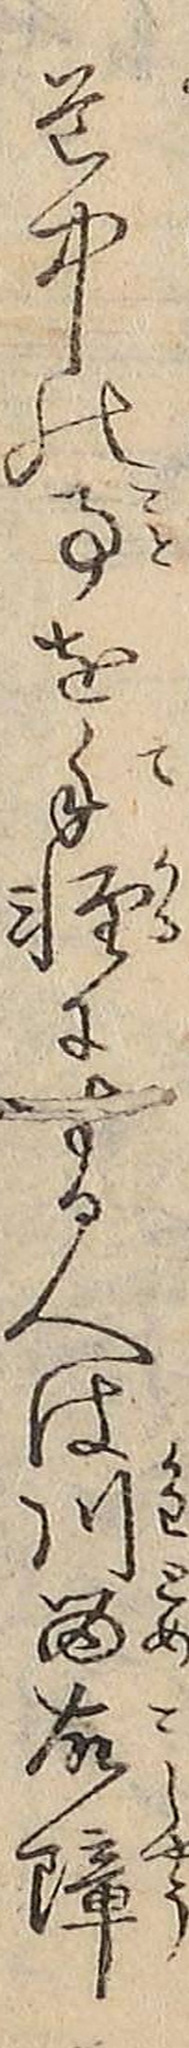道中の事を手軽にする人は川留故障
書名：旅行用心集
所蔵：神戸大学附属図書館 国文学研究資料館
